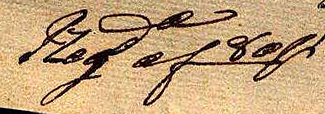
Regda a f 80V
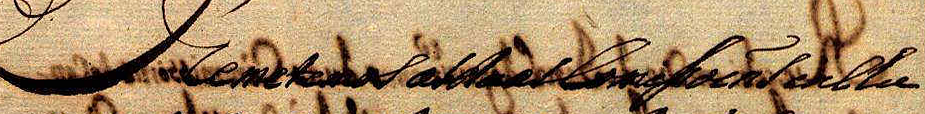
RemetemoS as taes Comissoen̄S esCLu
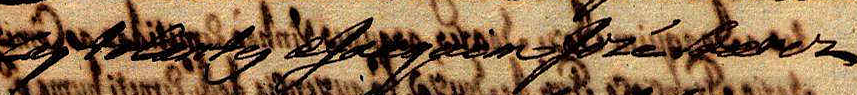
zas toCantes a Joaquim Jozé Soarez
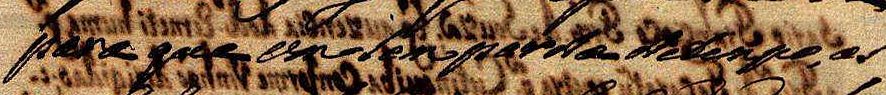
para que vm sem perda de tempo, as
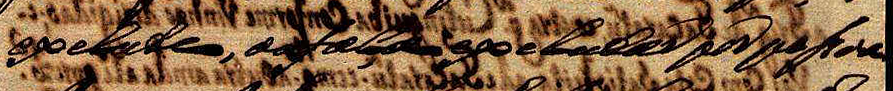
execute, ou faÇa exeCutar por pessoa
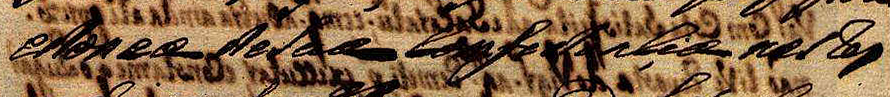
edonea de sua ConfidenÇia nas Res
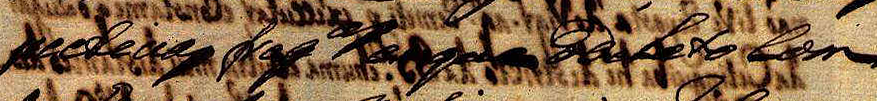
pectivas fregas o que o deLato Com
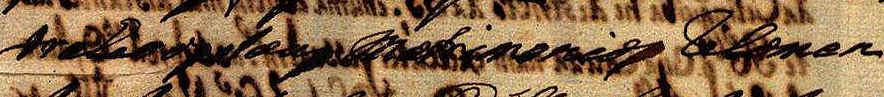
trahio os dous Matrimonios RiComen
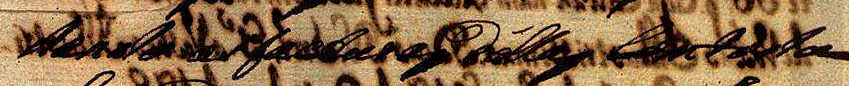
dando as facturas déllas Com toda
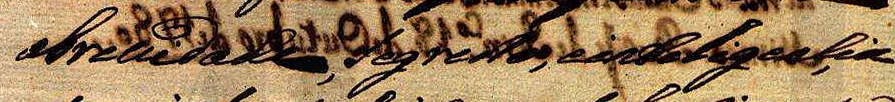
a breuidade, segredo, e inteLigenÇia
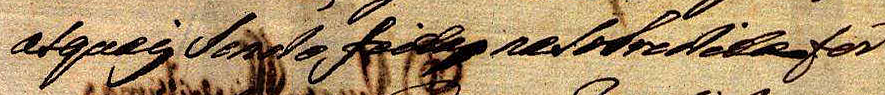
as quais, Sendo feitas na Sobredita for
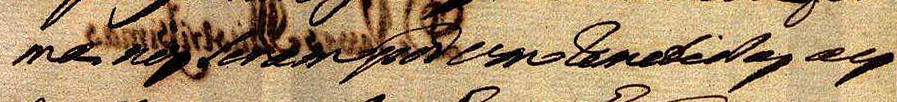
ma nos seram por vm Remetidas a es
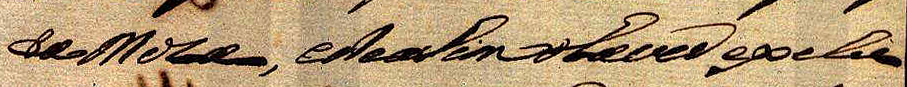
ta Meza, e de asim o Levar exeCu
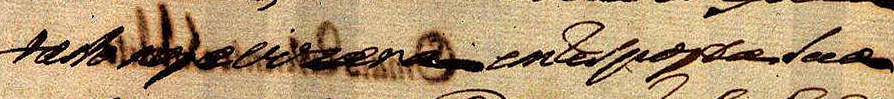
tado nos avizara em Resposta sua
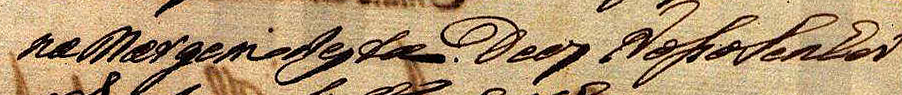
na Margem desta. Deos Nosso Senhor
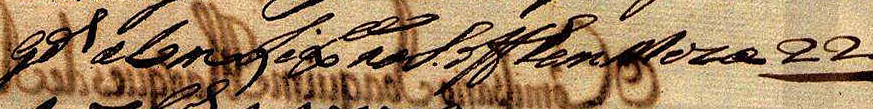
gde a Vm Lixa no S. offo hem Meza 22
